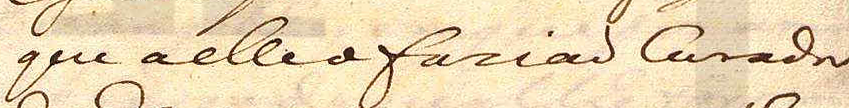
que a elle o faziaõ Curador
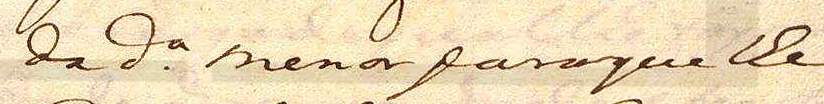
da d.a menor para que lhe
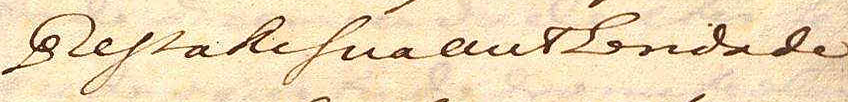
prestasse sua authoridade
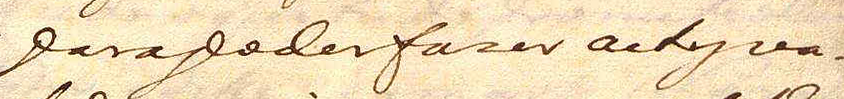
para poder fazer actos va
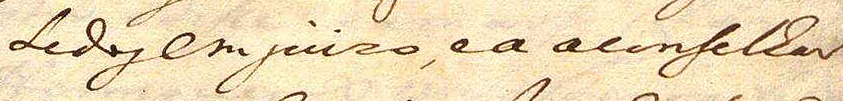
Lidos em juizo, e a aconselhar
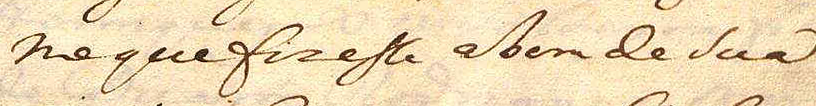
no que fizesse a bem de sua
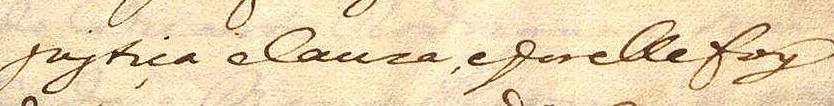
justiça e Cauza, e por elle foy
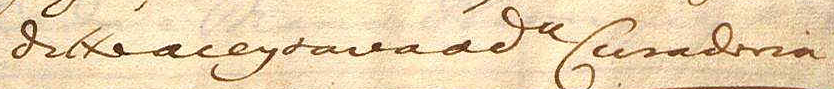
ditto aceytava a da Curadoria
